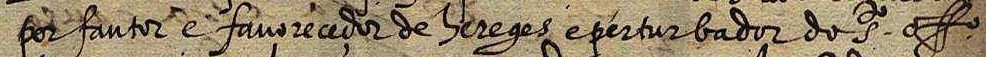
por fautor e fauorecedor de hereges e perturbador do s.to offo.
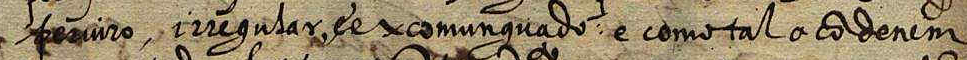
peruizo, irregular, e excomunguado: e como tal o cōdenem
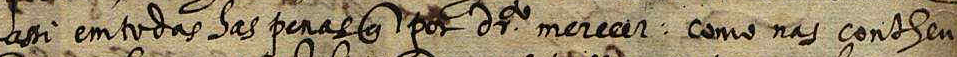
assi em todas has penas q̄ por dr.to merecer: como nas contheu
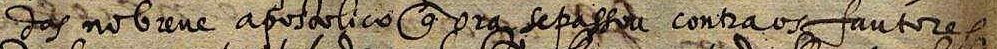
das no breue apostolico q̄ ora se passou contra os fautores
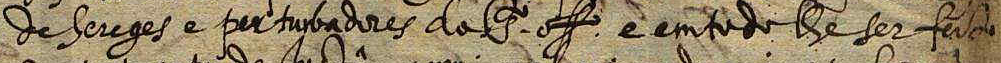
de hereges e pertubadores do sto. offo. e em todo lhe ser feito
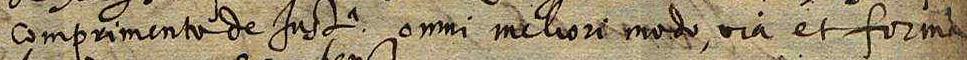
comprimento de Justa. omni meliori modo, via et forma
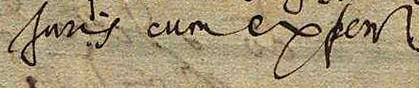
Juris cum expen̄
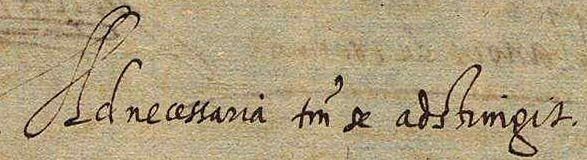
Ad necessaria tm̄ se adstringit.
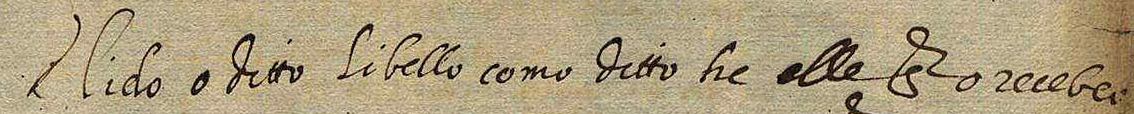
e lido o ditto Libello como ditto he elle sor o recebeo
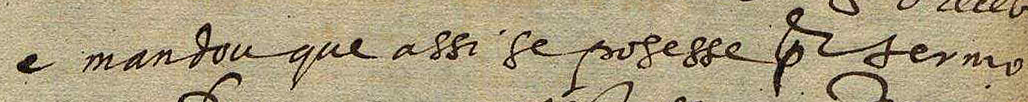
e mandou que assi se posesse por termo
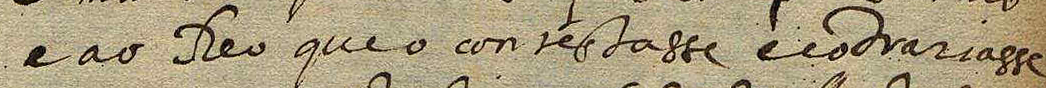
e ao Reo que o contestasse e cōtrariasse
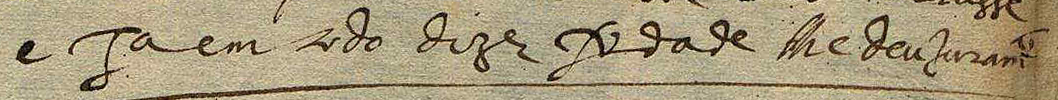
e ꝑa em todo dizer ꝟdade lhe deu Juramto
